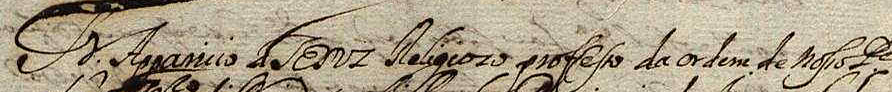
Fr. Apparicio d IEZUS Religiozo professo da ordem de nosso P.e
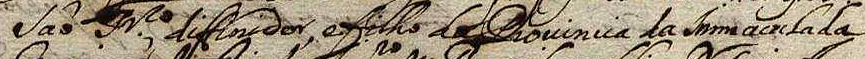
São Fr.co diffinidor, e filho da Prouincia da Inmaculada
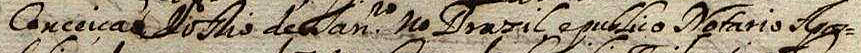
Conceiçaõ do Rio de Ian.ro no Brazil e publico Notario Apos
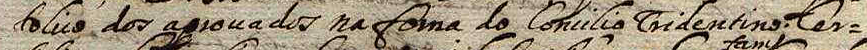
tolico dos aprouados na forna do Concilio Tridentino. Cer
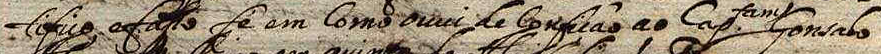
tifico e fasso fe em Como ouui de Confiçaõ ao Cap.tam Gonsalo
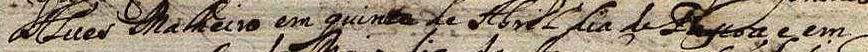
ALues Malheiro em quinze de Abril dia de P_scoa, e em
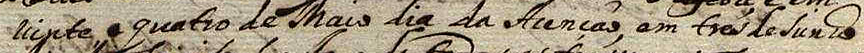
uinte e quatro de Maio dia da Asençaõ, em tres de Iunho
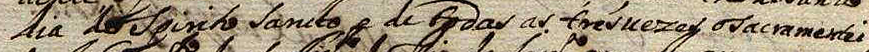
dia do Spirito Sancto, e de todas as tres uezes o sacramentei
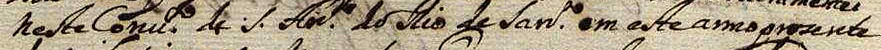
neste Conu.to de S. An.to do Rio de Ian.ro em este anno prezente
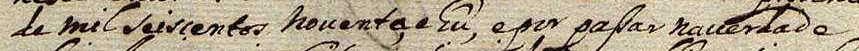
de mil seiscentos nouenta, e hū, e por passar na uerdade
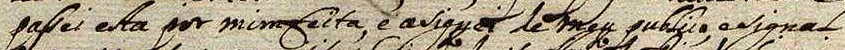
passei esta por mim feita, e asignei de meu publico, e signal
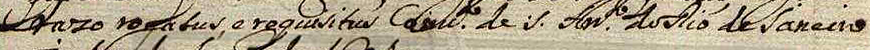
razo rogatus, e requisitus Conu.to de S. An.to do Rio de Ianeiro
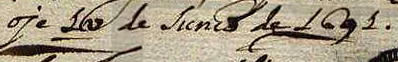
oje 10 de Iunho de 1691.
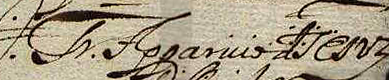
Fr. Apparicio d̄ IESVZ
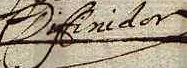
Diffinidor
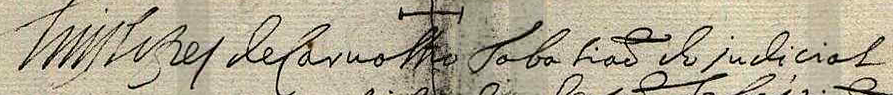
luis lopes de Carualho Tabaliaõ do judicial
